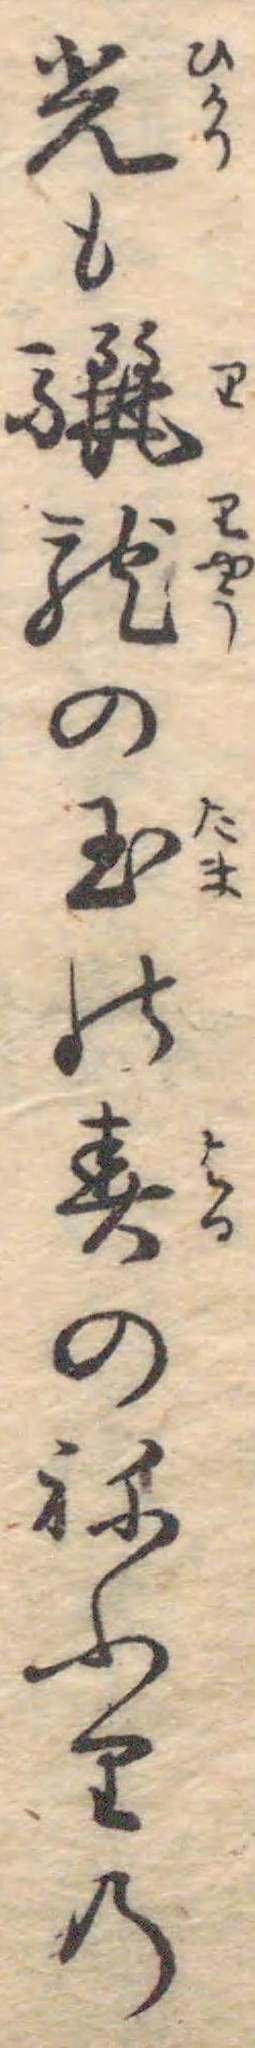光も驪竜の玉の春のねふりの
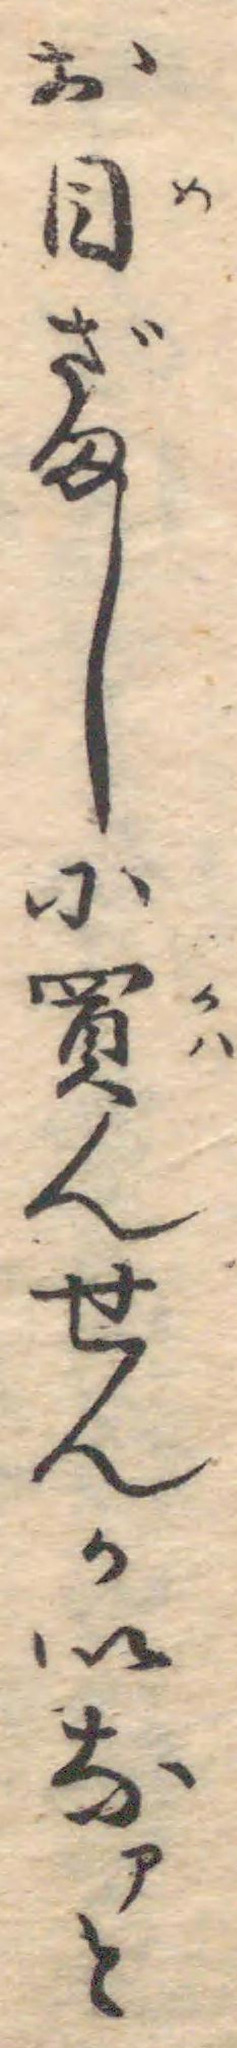お目ざましに買んせんかいなァと
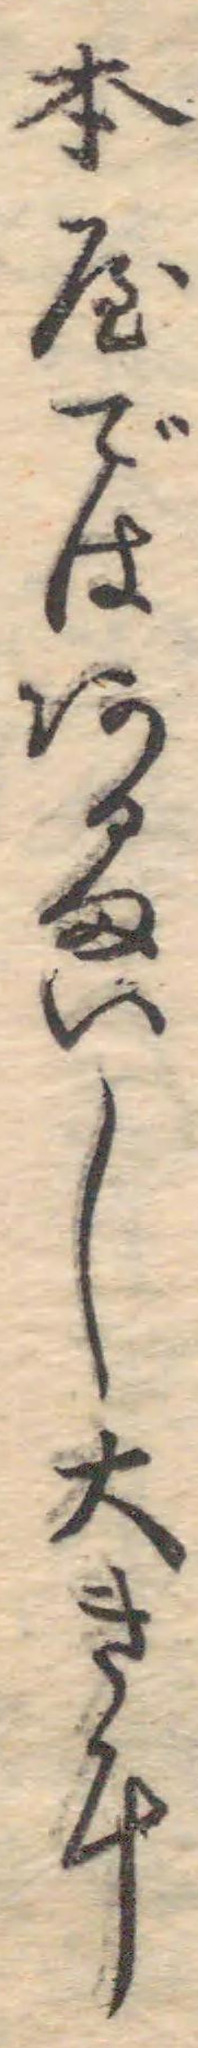本屋ではあるまいし大きに
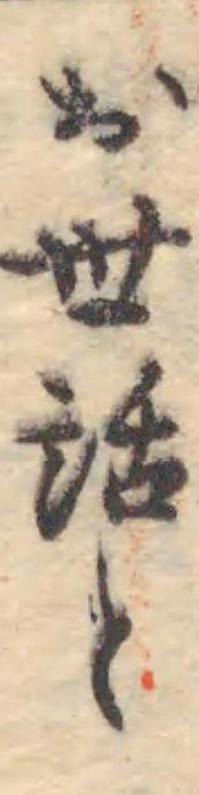お世話と
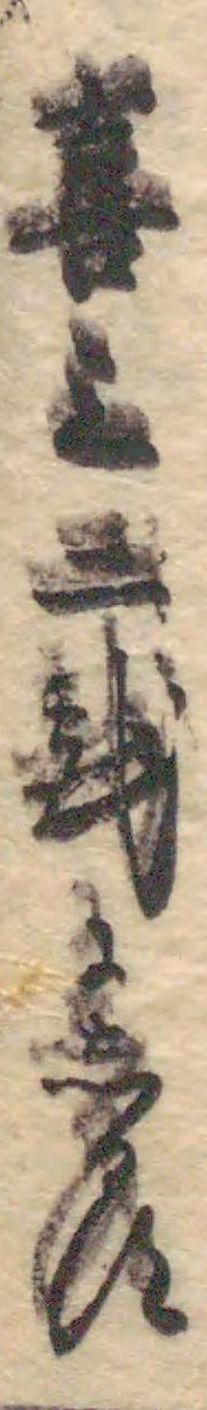喜三二戯にしるす
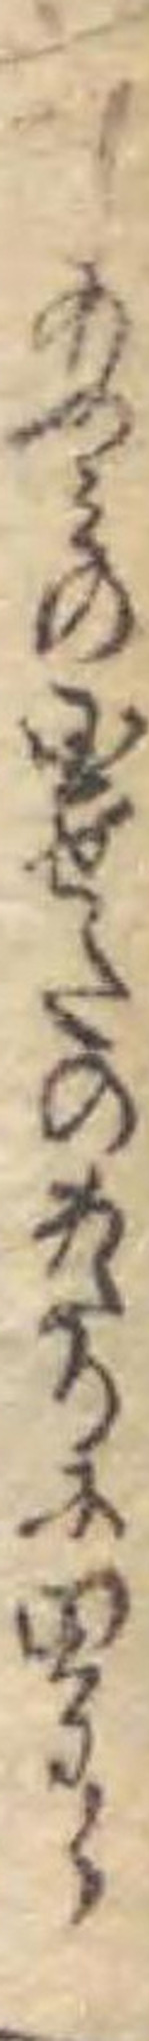あふみの国せたのあたりに田わら
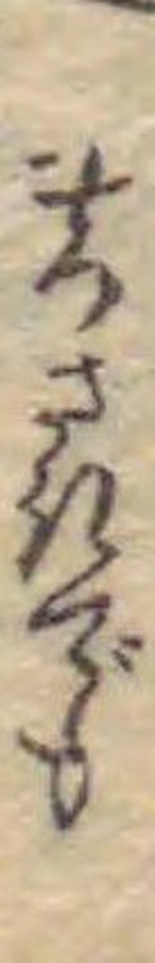まつさきでも
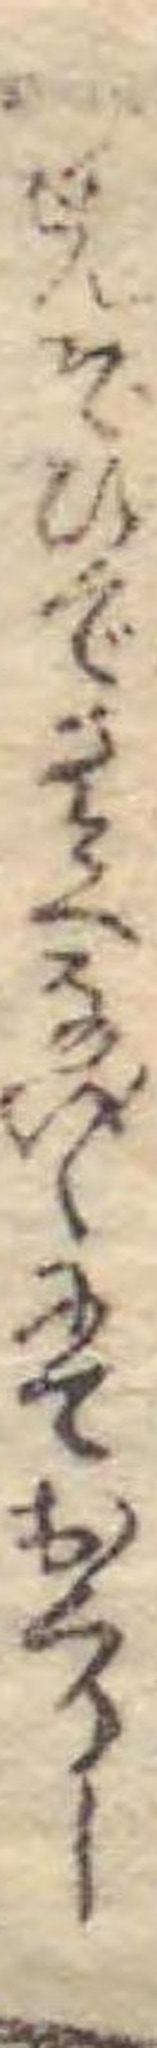せんぞひでさとへない〳〵にておくりし
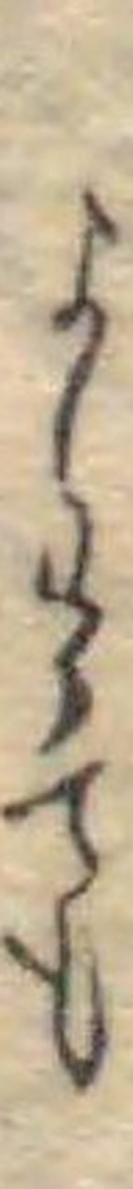よしわらても
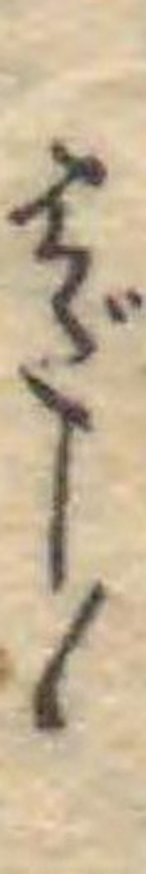はだし〳〵
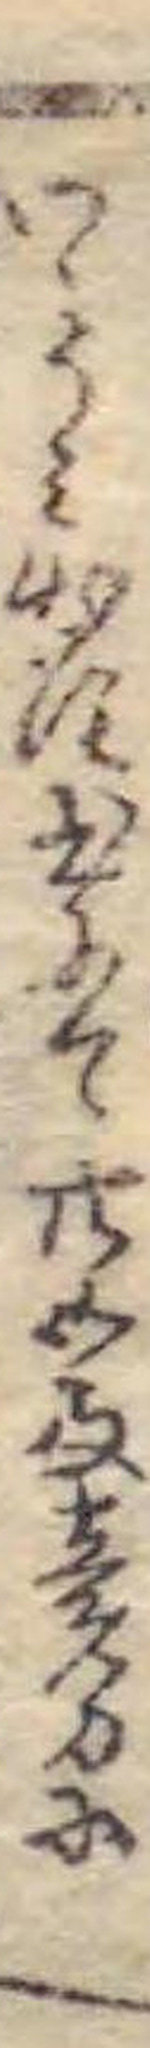つゝうみ出す玉にて廿五両壱分に
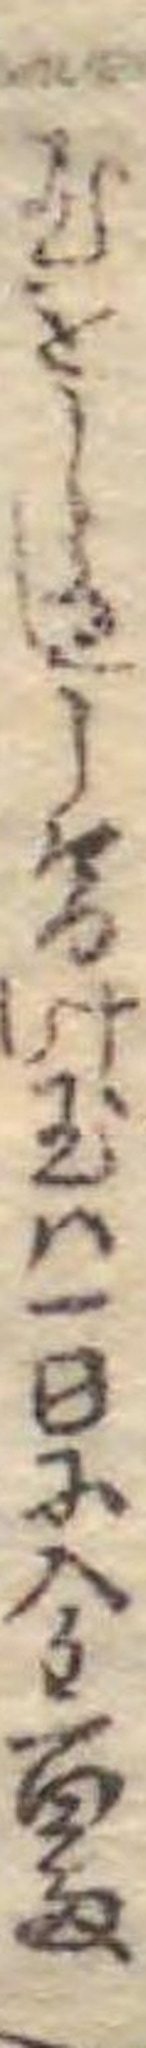玉をしよししける此玉は一日に金百両
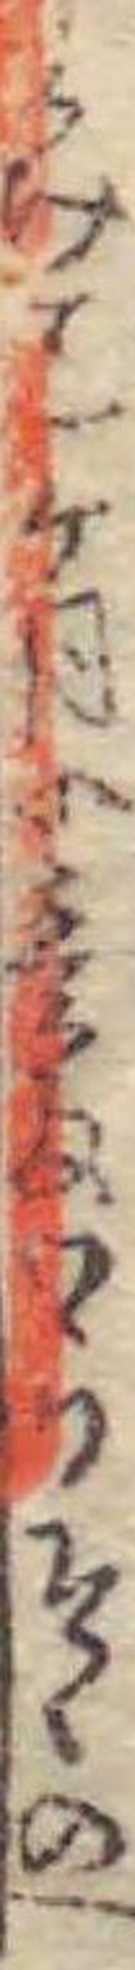しかけて一ヶ月に壱両つゝりそくの
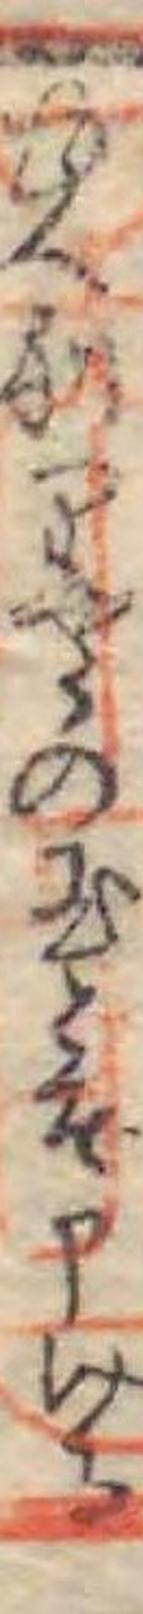ゆへ利？りやうの玉とぞ申ける
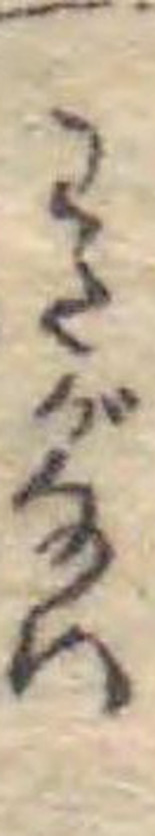わたがなは
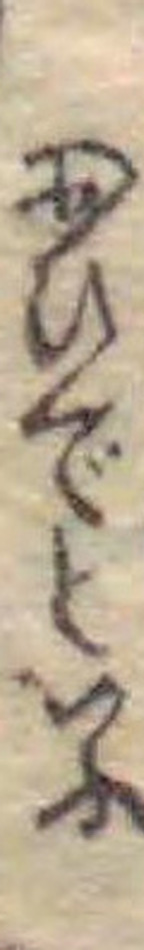おひでといふ
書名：鐘入七人化粧 : 3巻
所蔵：国立国会図書館 National Diet Library, JAPAN
